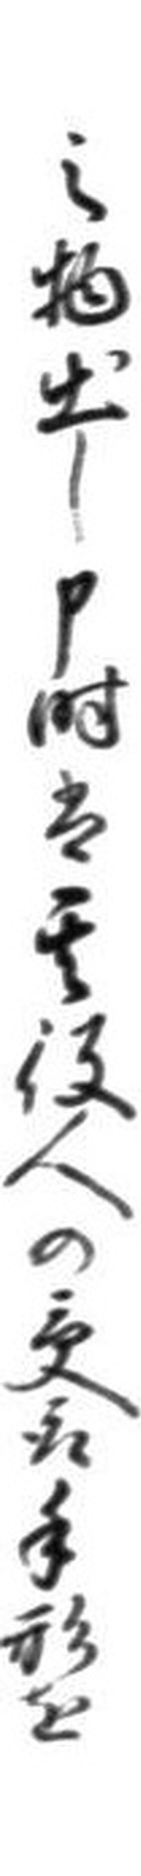之物出し申時は其役人の受取手形を

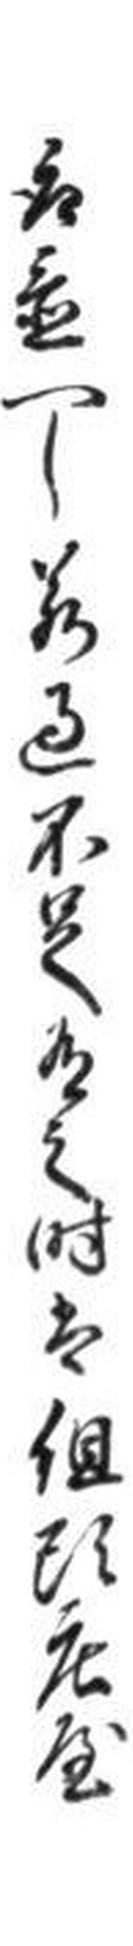取置へし若過不足有之時は組頭庄屋
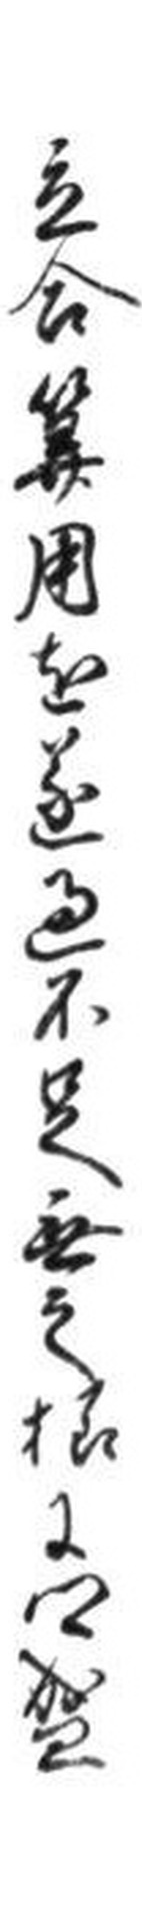立合算用を遂過不足無之様に郷盛
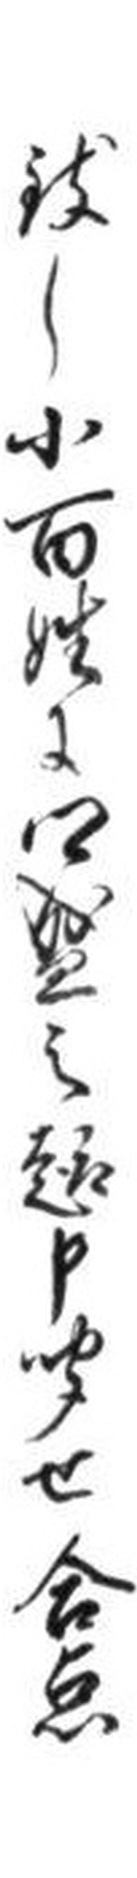致し小百姓に郷盛之趣申聞せ合点
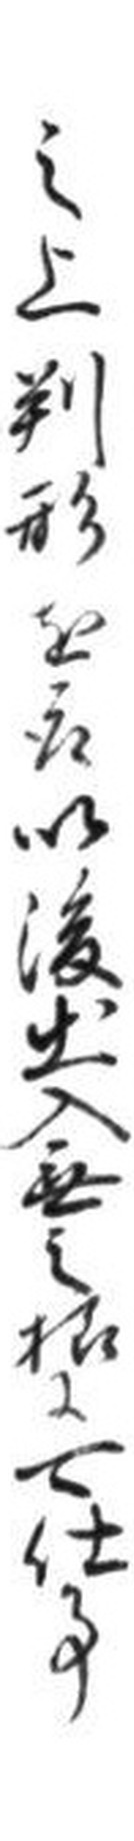之上判形を取以後出入無之様に可仕事
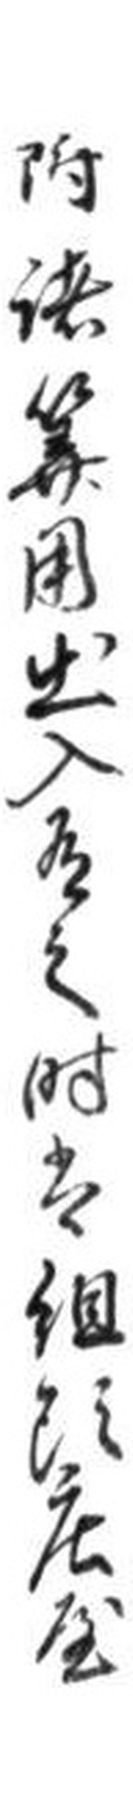附諸算用出入有之時は組頭庄屋
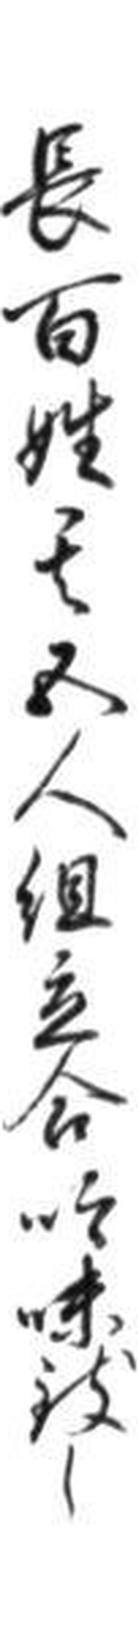長百姓其五人組立合吟味致し
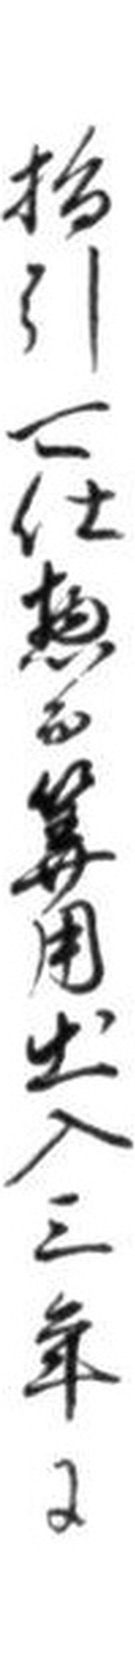指引可仕惣而算用出入三年に
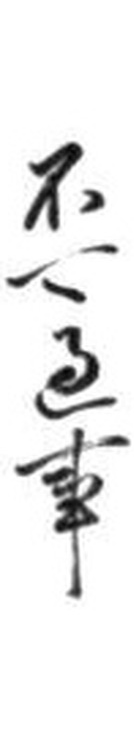不可過事
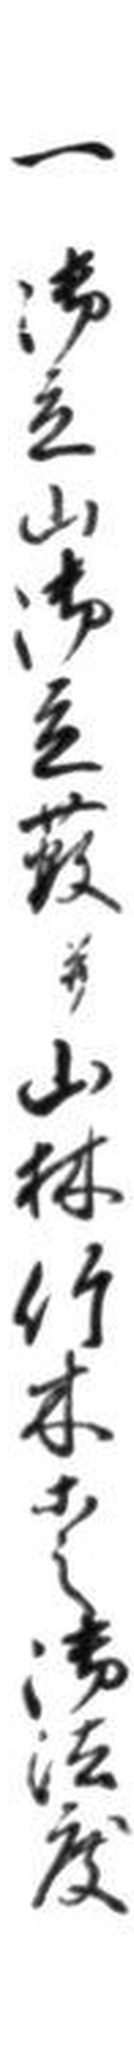一御立山御立薮并山林竹木等之御法度
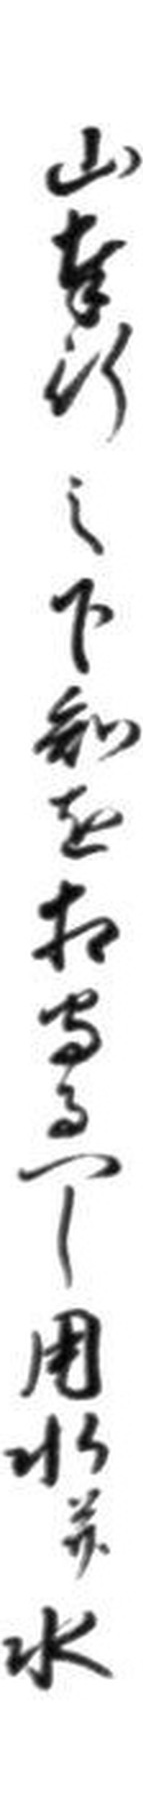山奉行之下知を相守るへし用水并水
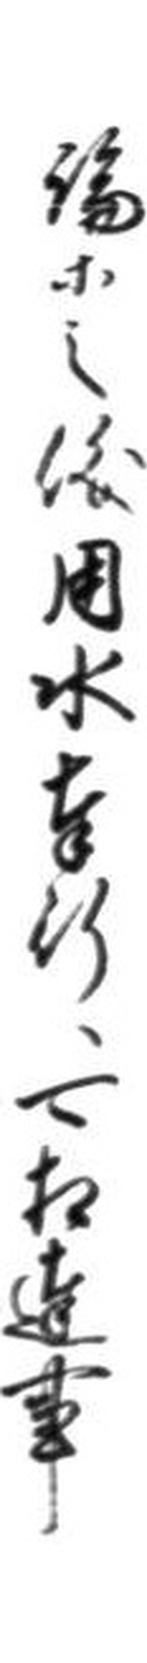論等之儀用水奉行へ可相達事
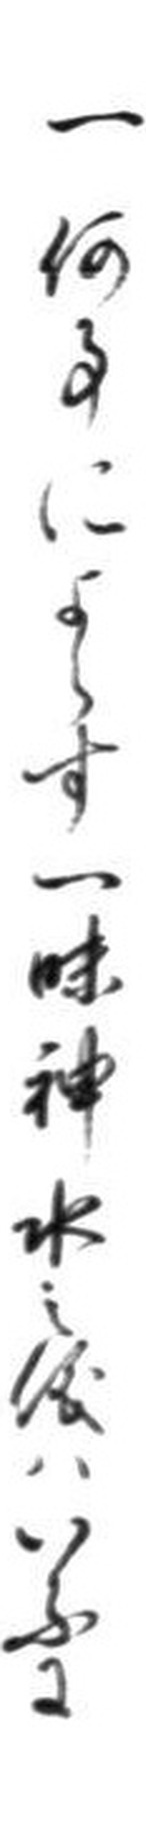一何事によらす一味神水之儀はいふに
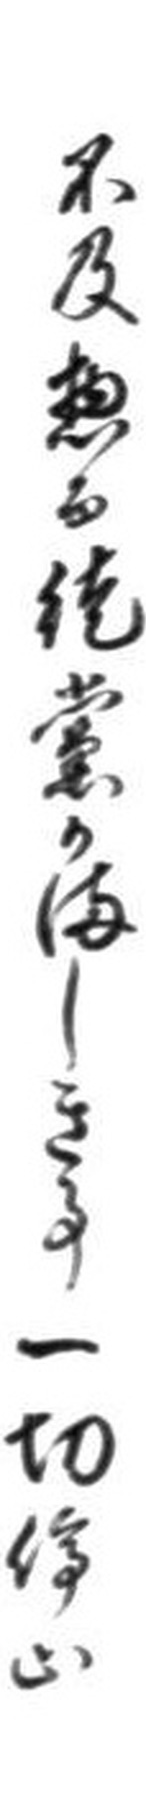不及惣而徒党かましき事一切停止
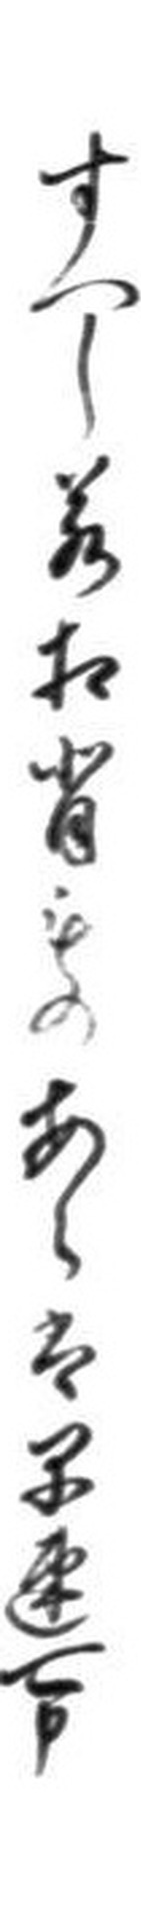すへし若相背ものあらは早速可申
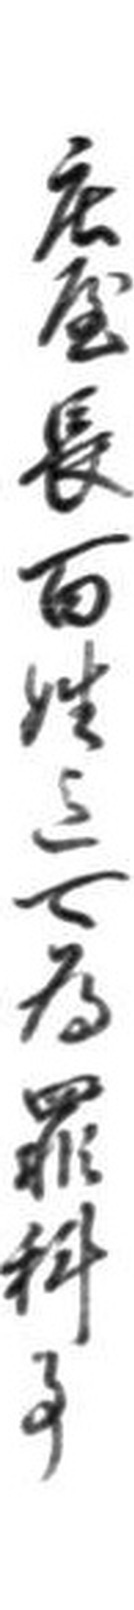庄屋長百姓迄可為罪科事
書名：家譜 十六 吉品公 従貞享三年閏三月到同四年
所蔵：福井県文書館 Fukui Prefectural Archives
